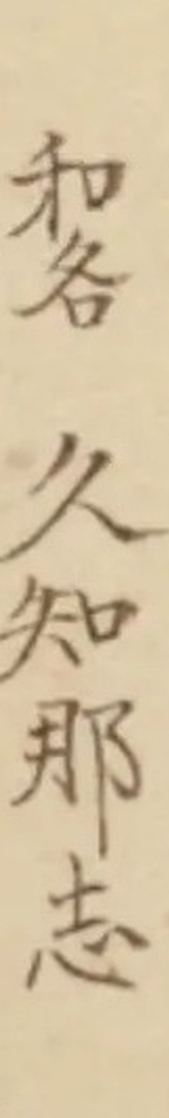和名久知那志
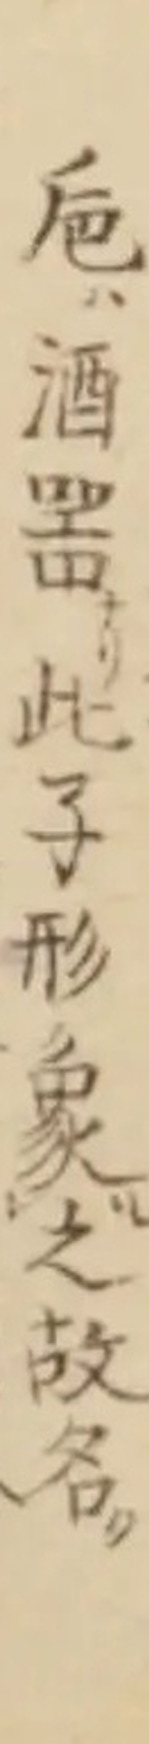巵ハ酒器ナリ此子形象ル之故名ク
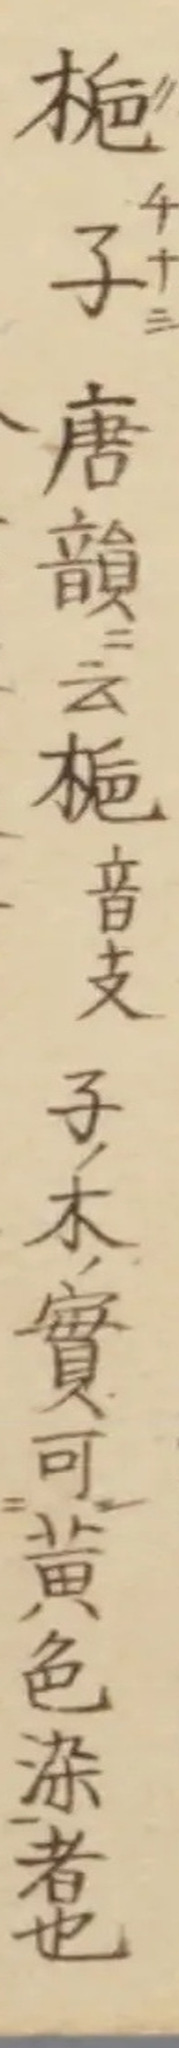梔子唐韻ニ云梔音支子ノ木ノ實可ソ黄色染者也
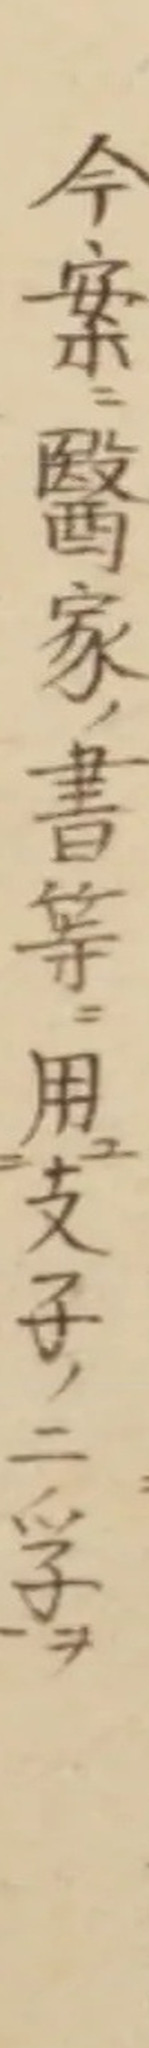今案ニ醫家ノ書等ニ用ユ支子ノ二孚ヲ
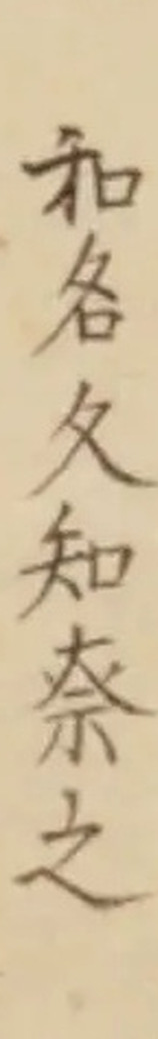和名久知奈之

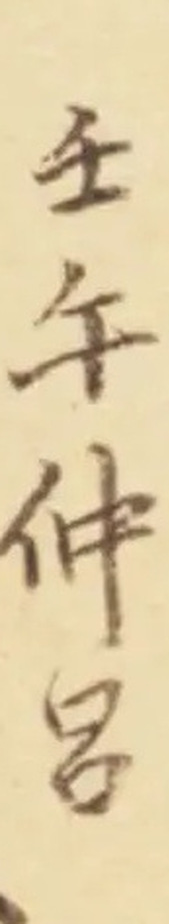壬午仲呂
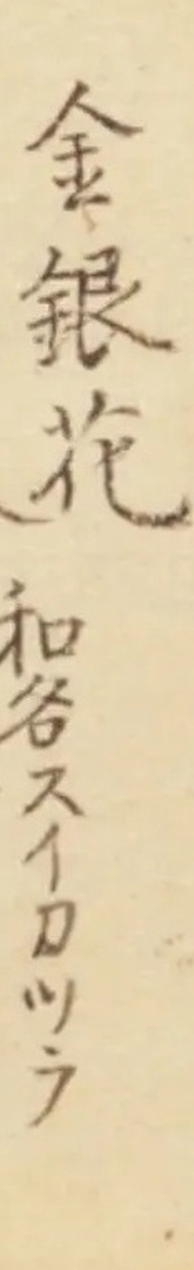金銀花和名スイカツラ
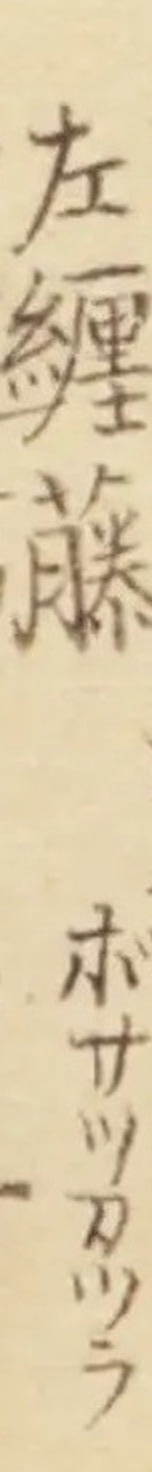左纒藤ボサツカツラ
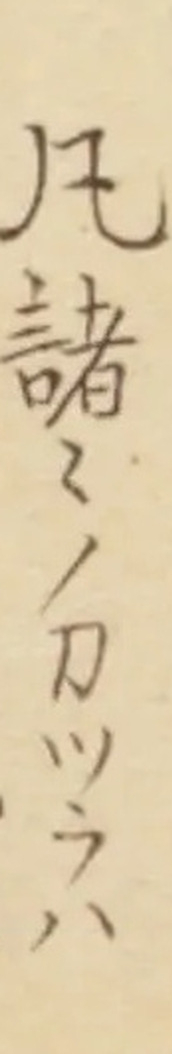凡諸々ノカツラハ
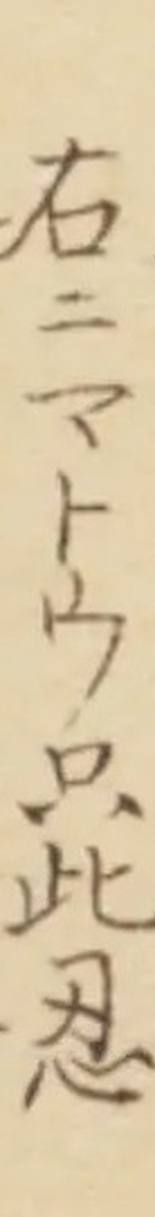右ニマトウ只此忍
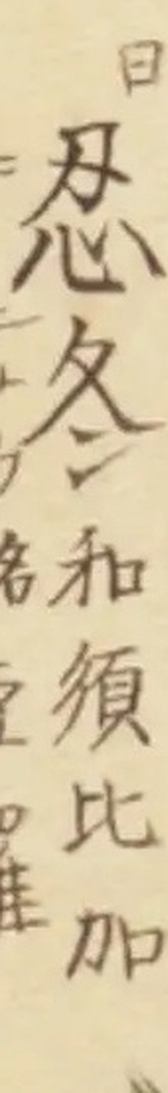曰忍冬和須比加
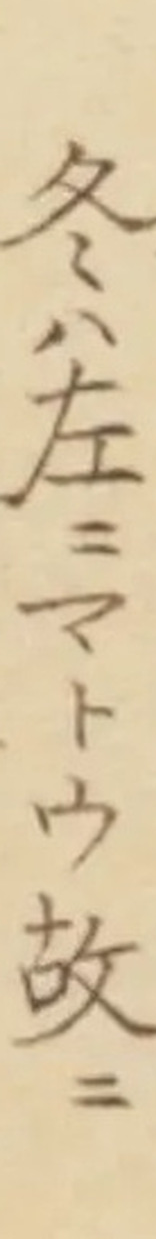冬ハ左ニマトウ故ニ
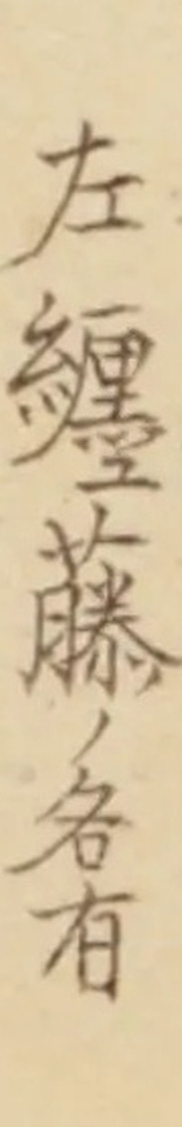左纒藤ノ名有
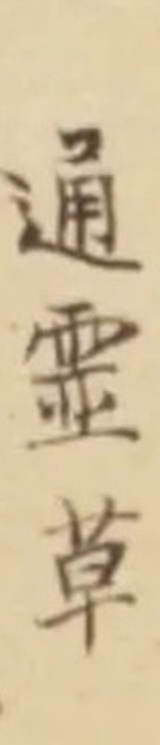通霊草

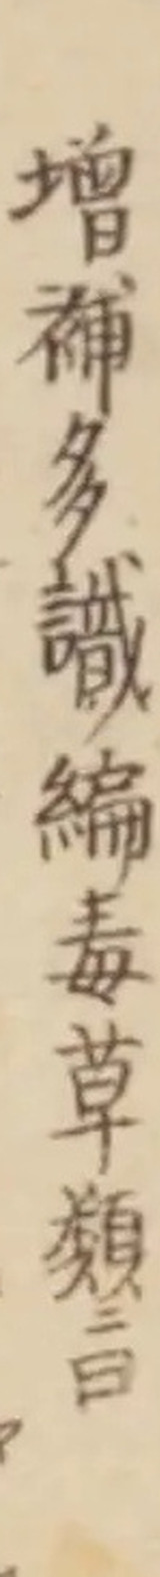増補多識編毒草類に曰
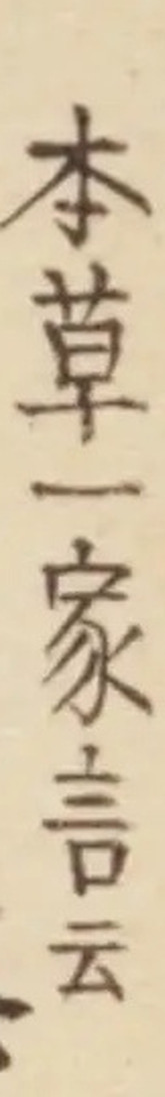本草一家言云
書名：梅園草木花譜夏之部. 1
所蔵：国立国会図書館 National Diet Library, JAPAN
